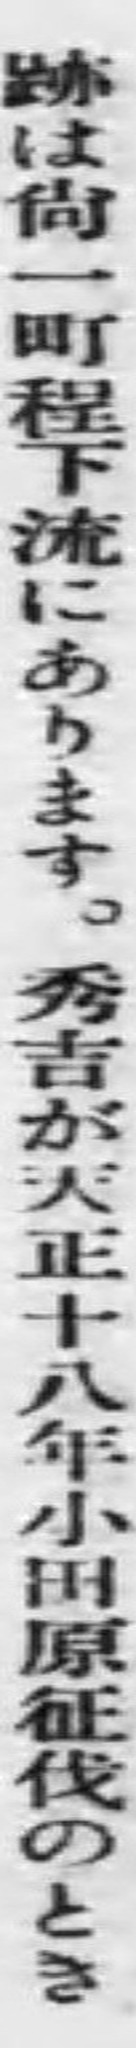跡は尚一町程下流にあります。秀吉が天正十八年小田原征伐のとき
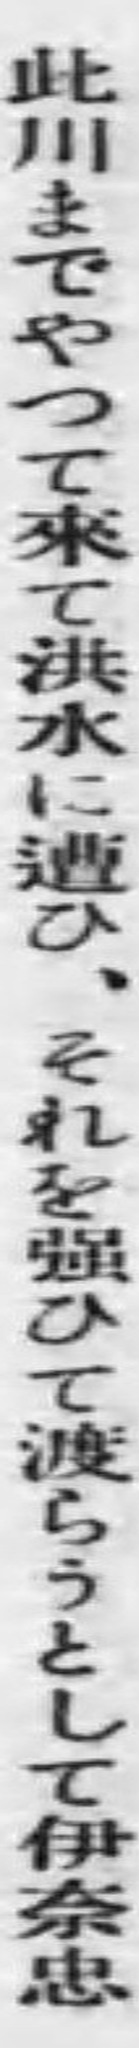此川までやつて来て洪水に遭ひ、それを強ひて渡らうとして伊奈忠

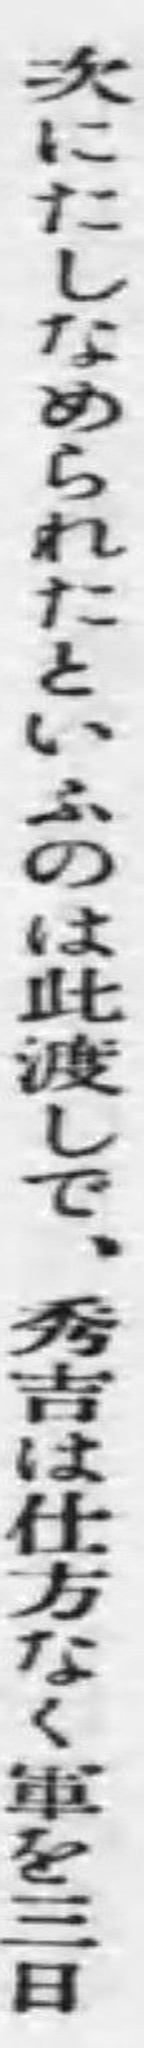次にたしなめられたといふのは此渡しで、秀吉は仕方なく軍を三日
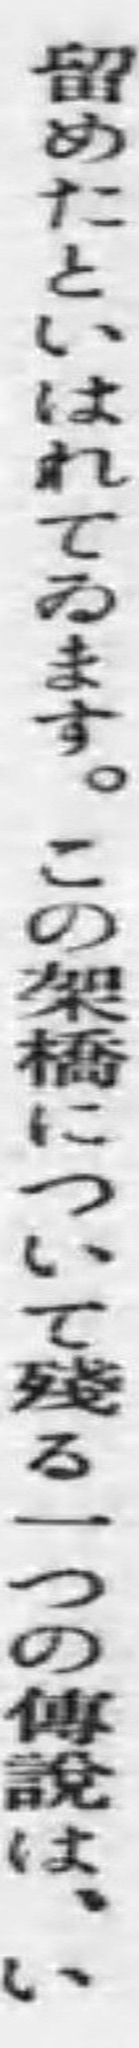留めたといはれてゐます。この架橋について残る一つの伝説は、い
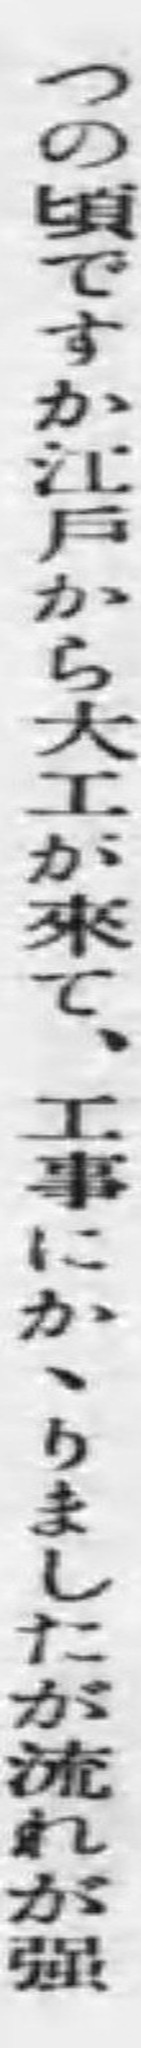つの頃ですか江戸から大工が来て、工事にかゝりましたが流れが強
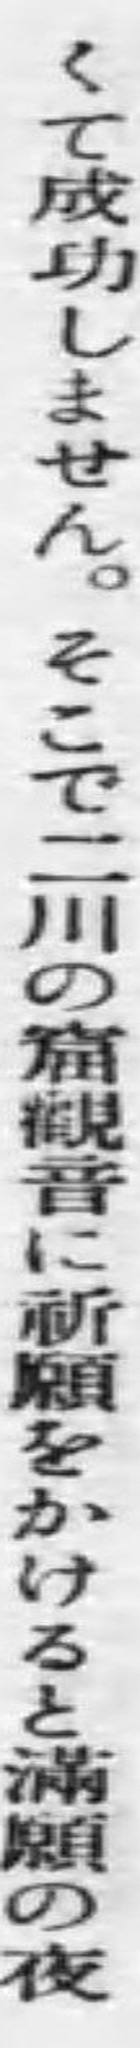くて成功しません。そこで二川の窟観音に祈願をかけると満願の夜
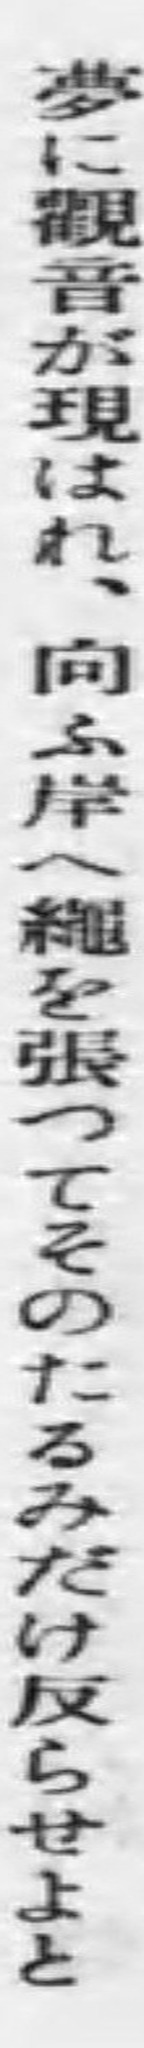夢に観音が現はれ、向ふ岸へ縄を張つてそのたるみだけ反らせよと
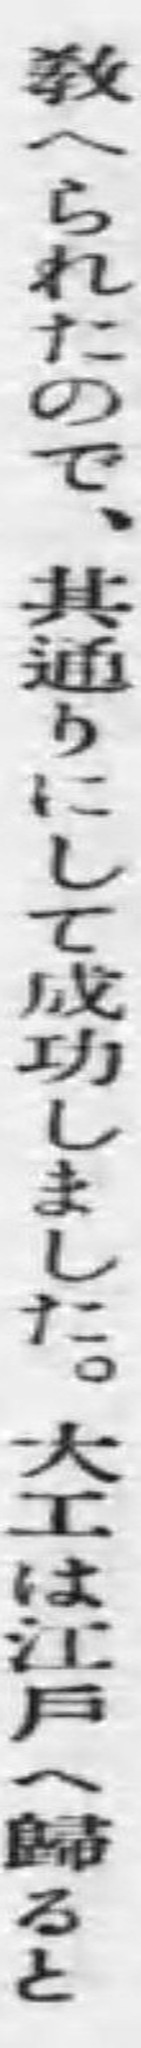教へられたので、其通りにして成功しました。大工は江戸へ帰ると
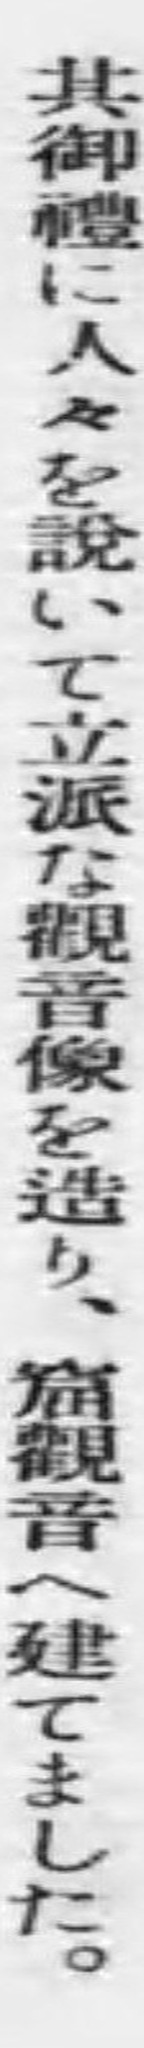其御礼に人々を説いて立派な観音像を造り、窟観音へ建てました。
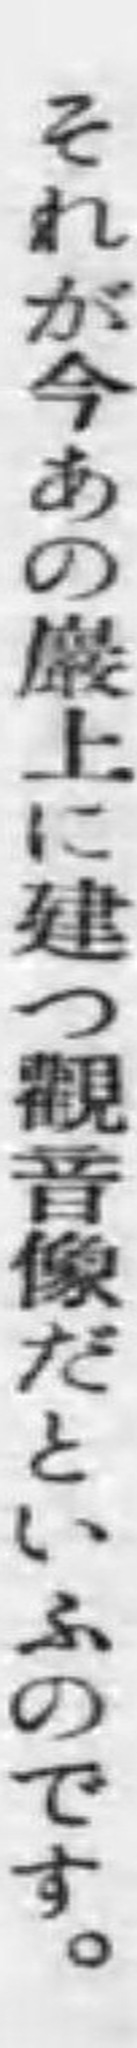それが今あの巌上に建つ観音像だといふのです。
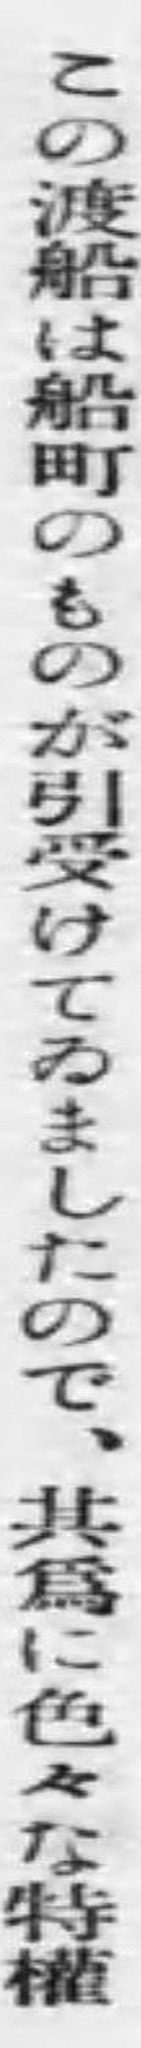この渡船は船町のものが引受けてゐましたので、其為に色々な特権
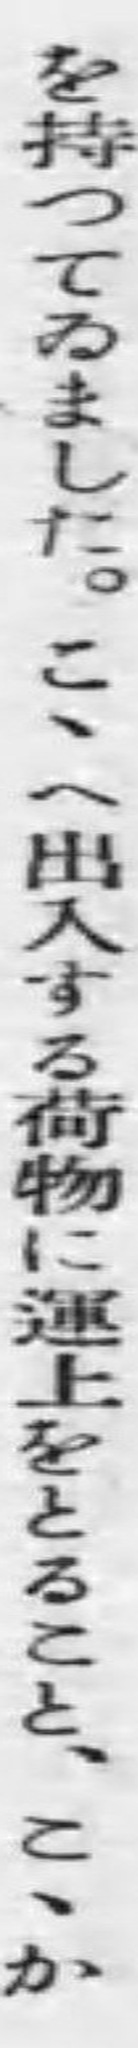を持つてゐました。こゝへ出入する荷物に運上をとること、こゝか
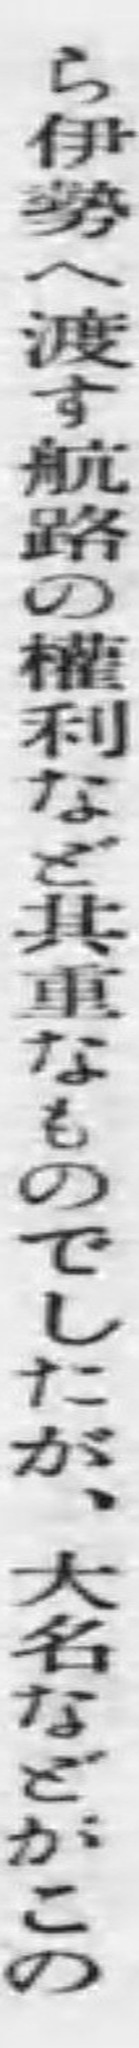ら伊勢へ渡す航路の権利など其重なものでしたが、大名などがこの
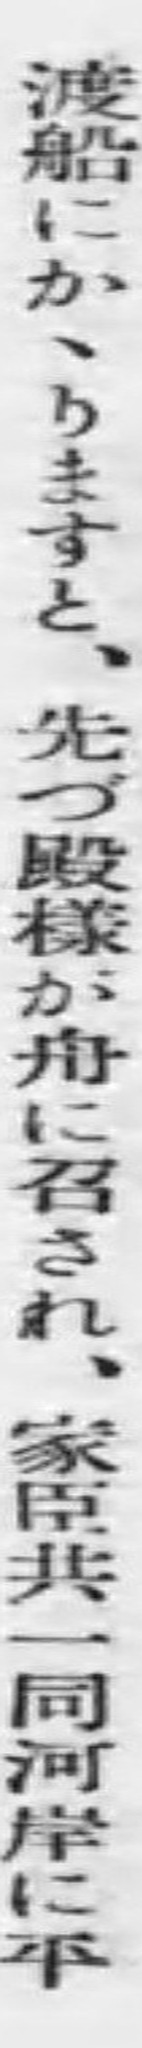渡船にかゝりますと、先づ殿様が舟に召され、家臣共一同河岸に平
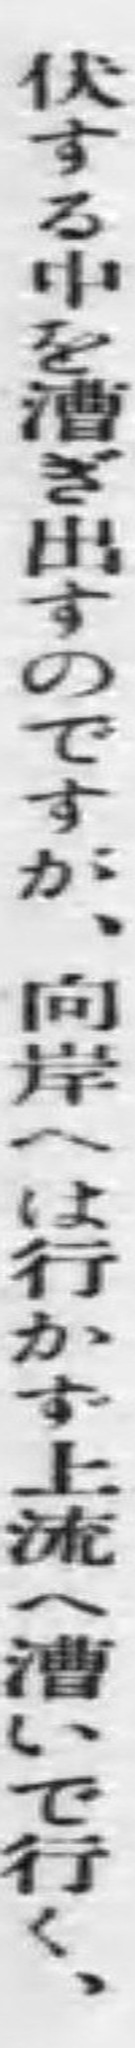伏する中を漕ぎ出すのですが、向岸へは行かず上流へ漕いで行く、
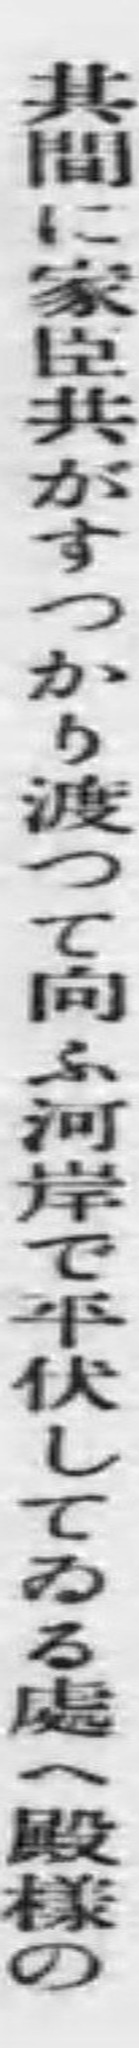其間に家臣共がすつかり渡つて向ふ河岸で平伏してゐる処へ殿様の
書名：東三河道中記 : 豊橋市及其附近案内
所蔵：国立国会図書館 National Diet Library, JAPAN
